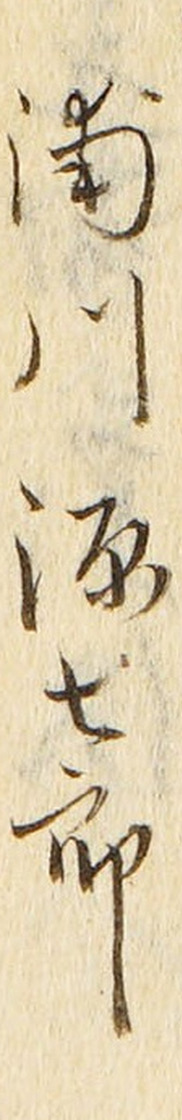浦川源七郎
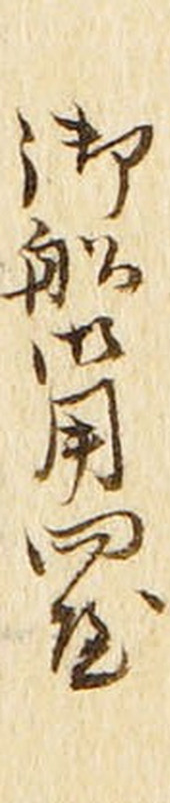御船御用四屋
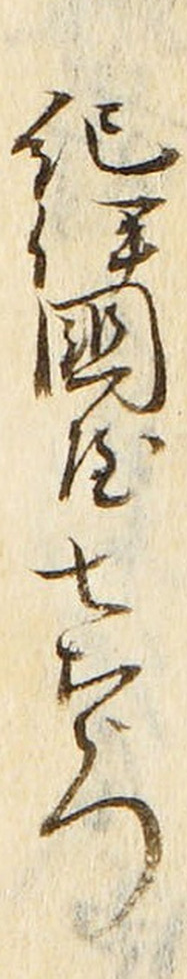紀伊国屋七右衛門
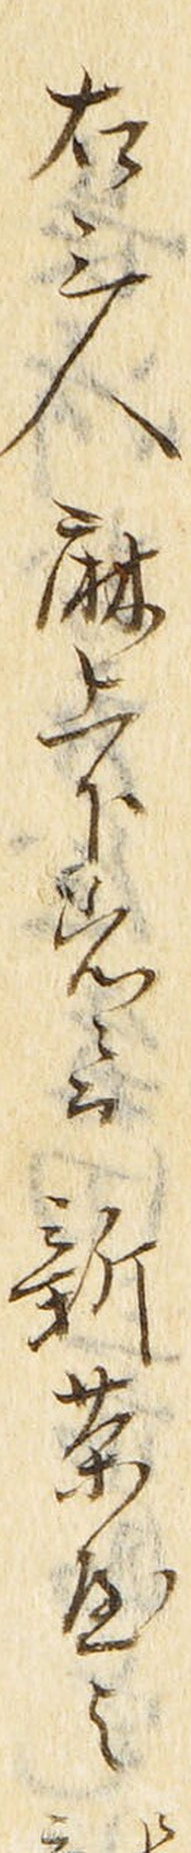右三人麻上下着に而新茶屋と
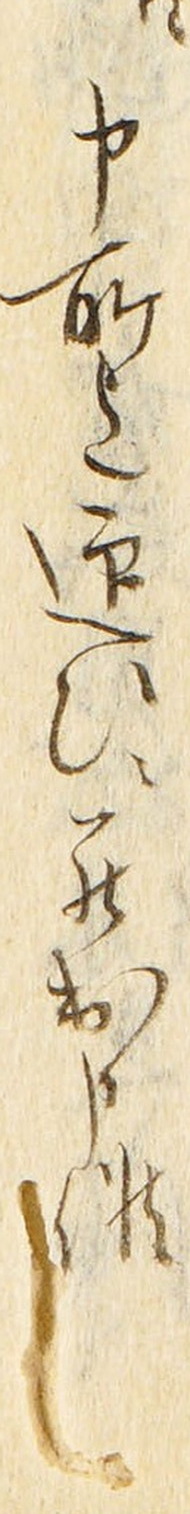申所迠迎ひに罷出申候
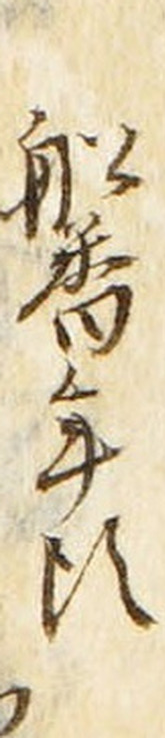船番年頭
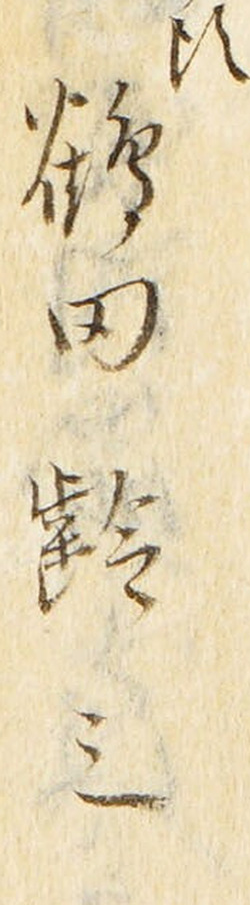鶴田齢三
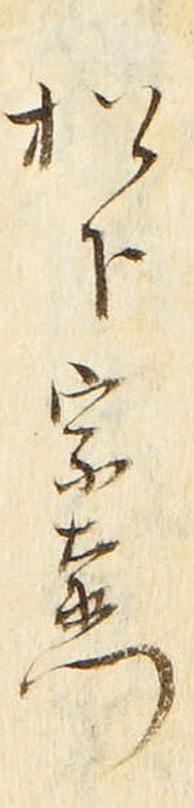松下宗右衛門
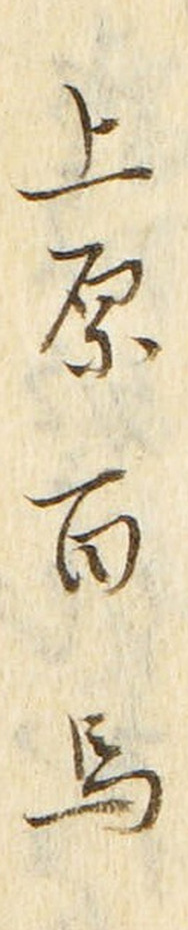上原百馬
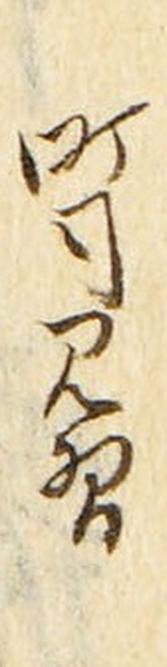町司見習
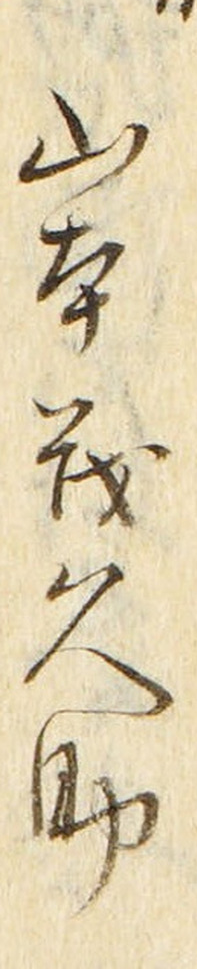山本茂久助

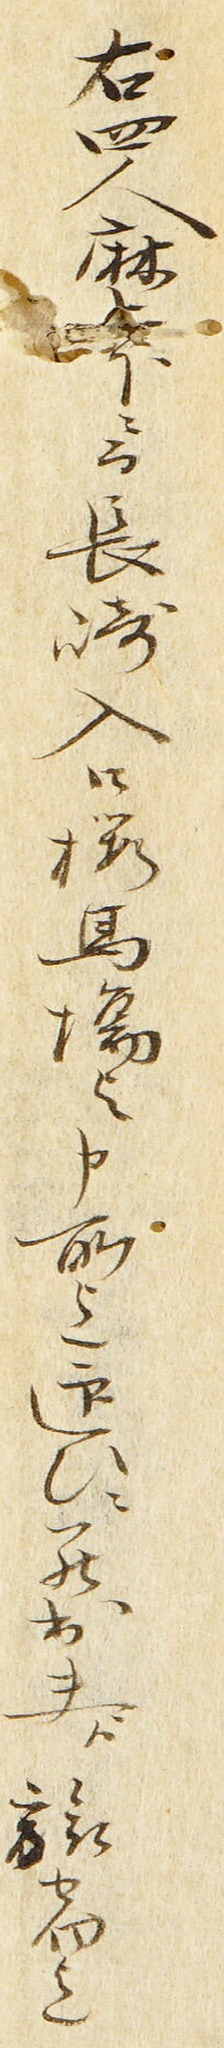右四人麻上下に而長崎入口桜馬場と申所迠迎ひに罷出夫ゟ旅宿迠
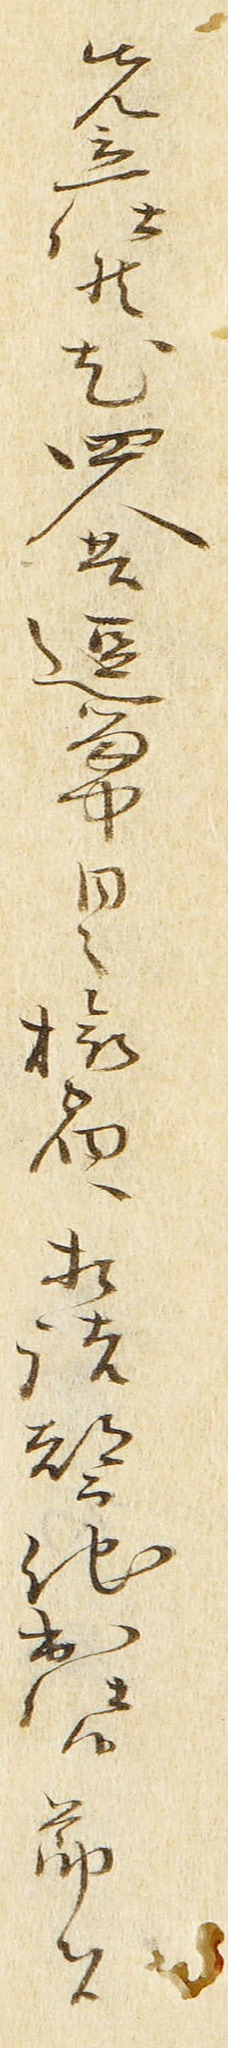先立仕候尤四人共逗留中日々旅宿へ相詰頭而他出仕候節は
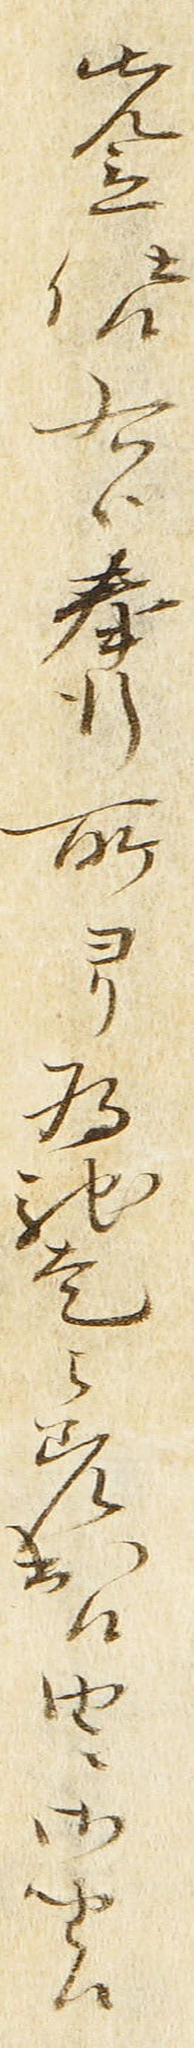先立仕候右は奉行所より為馳走の差出候由に御座候
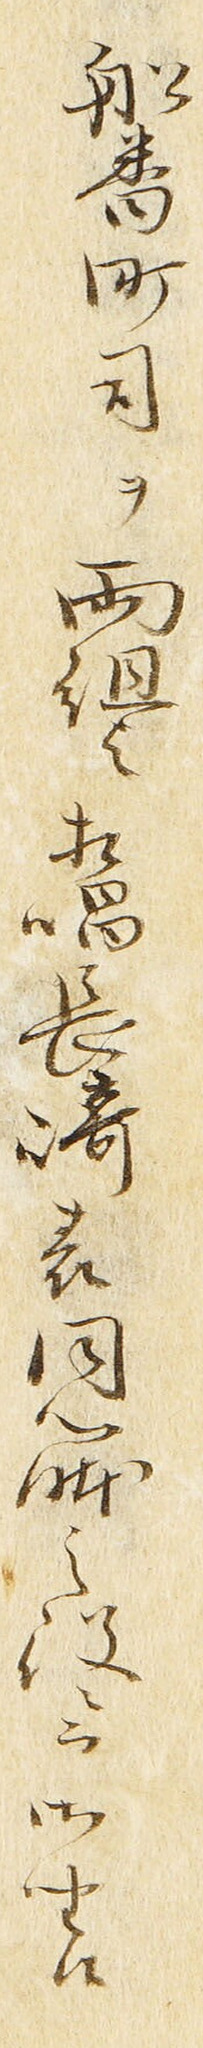船番町司を両組と相唱長崎表同心躰之役に而御座候
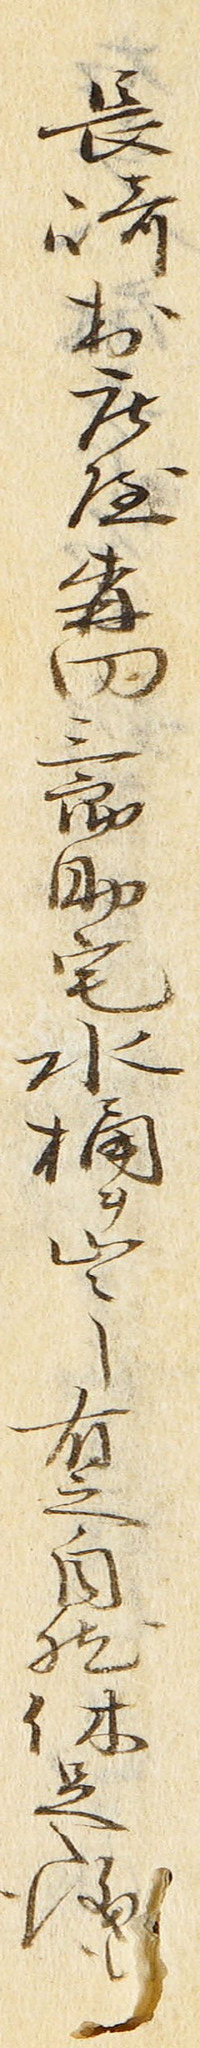一長崎於庄屋青田三郎助宅水桶ヲ出し有之自然休足之儀も
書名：長崎漂流記
